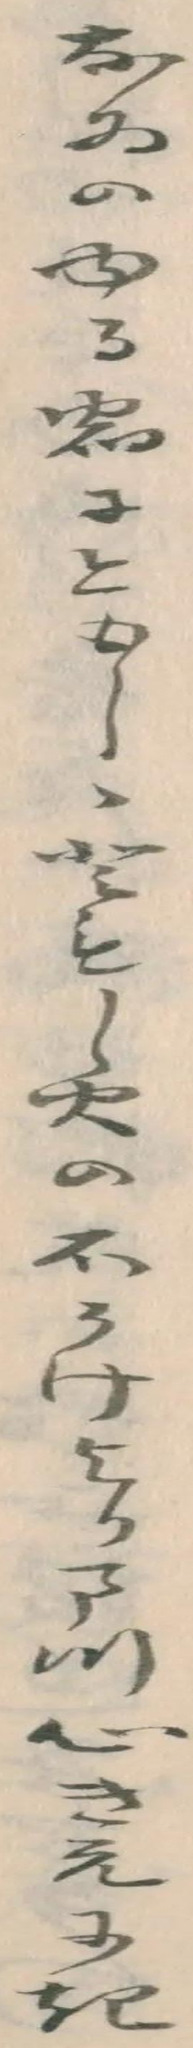なゐのゆる宿にともしゝともし火のほかけよりまつ心きえにき

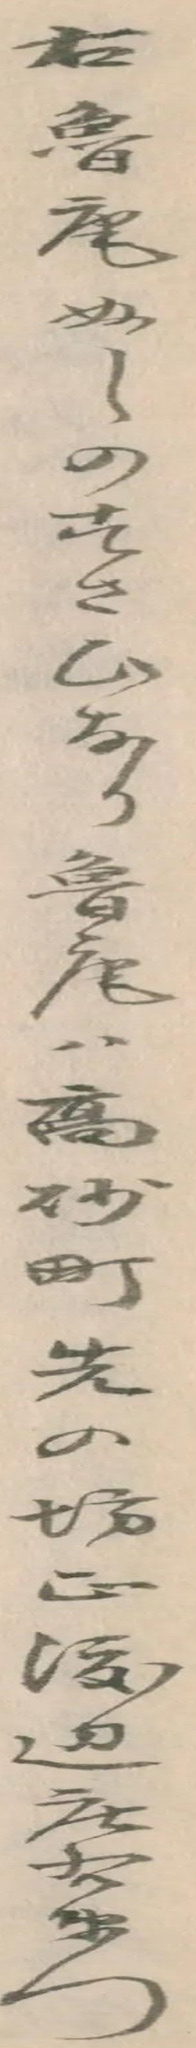右魯庵ぬしのすさひなり魯庵は高砂町先の坊正渡辺庄右衛門
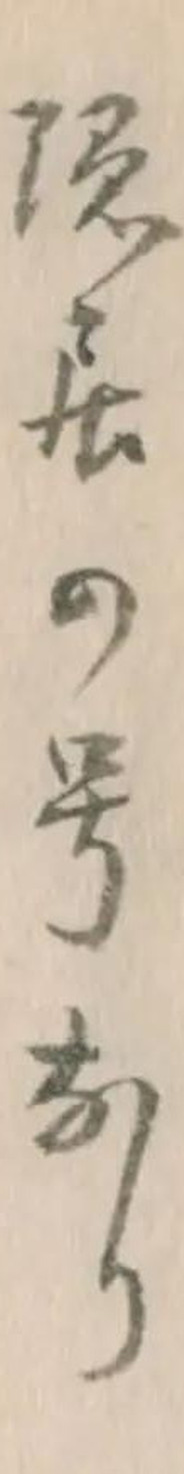隠居の号なり
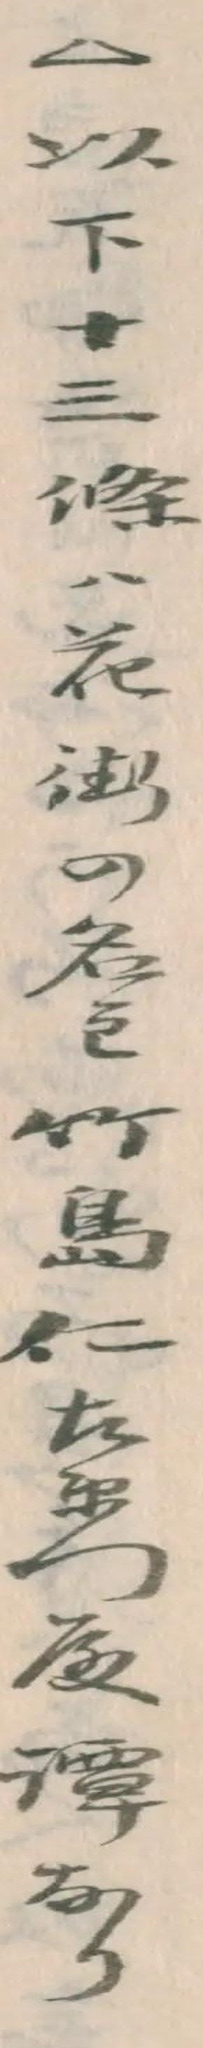△以下十三條は花街の名主竹島仁左衛門殿譚なり
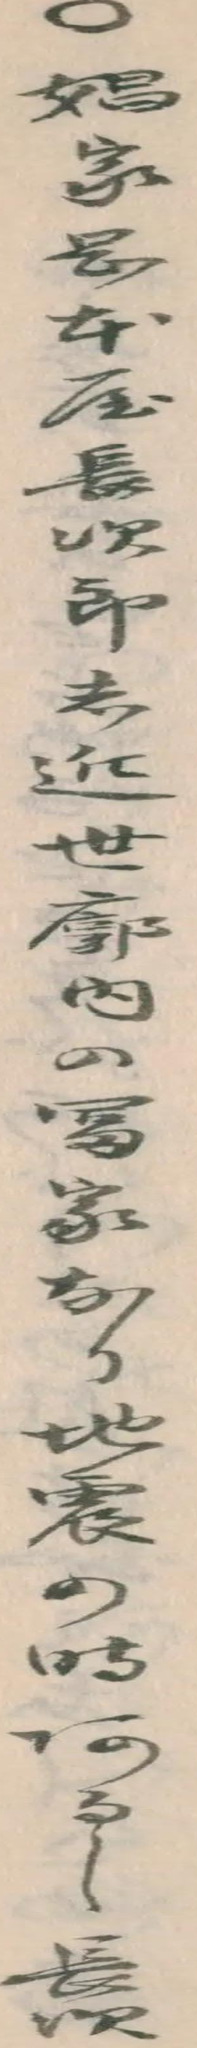〇娼家岡本屋長次郎は近世廓内の冨家なり地震の時あるし長次
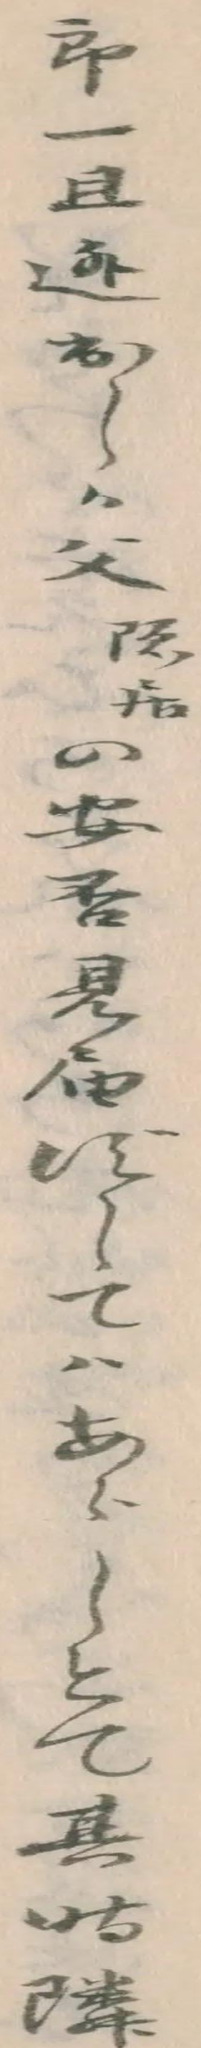郎一旦逃出しか父隠居の安否未届ずしてはあらしとて其時隣
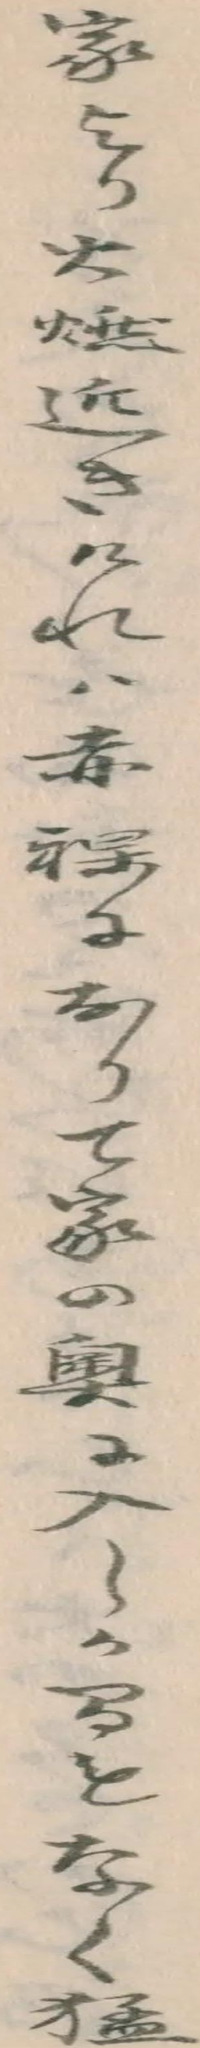家より火燃近きけれは赤裸になりて家の奥に入しか間もなく猛
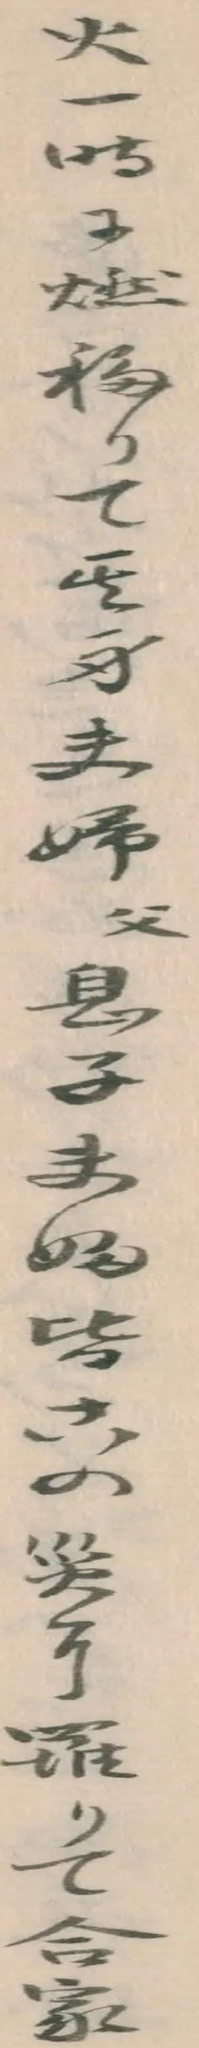火一時に燃移りて其身夫婦父息子夫婦皆この災に罹りて合家
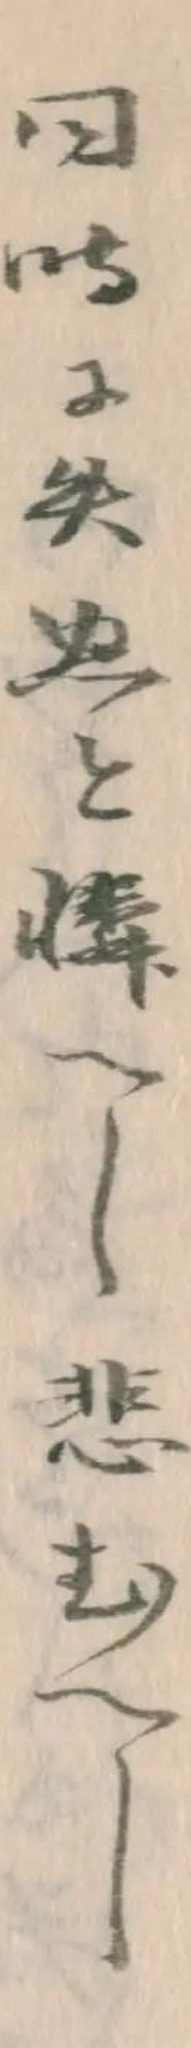同時に失ぬと憐へし悲むへし
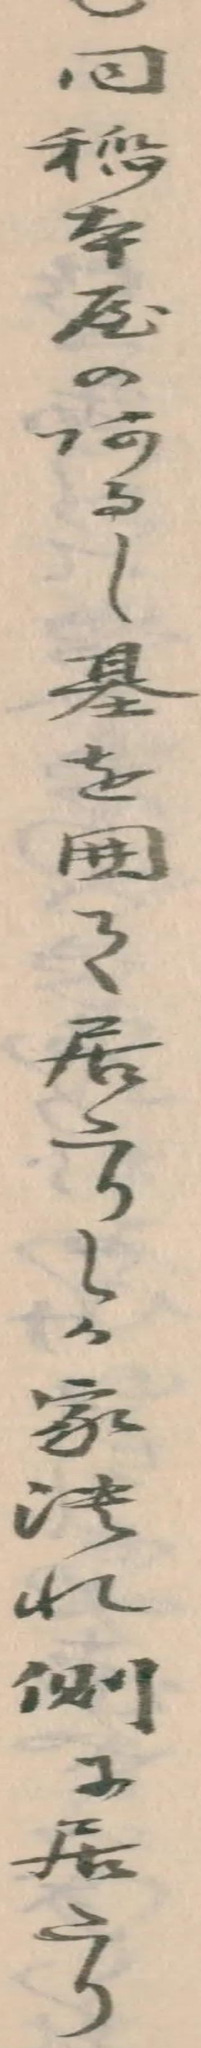〇同稲本屋のあるし基を囲て居たりしか家潰れ側に居たり
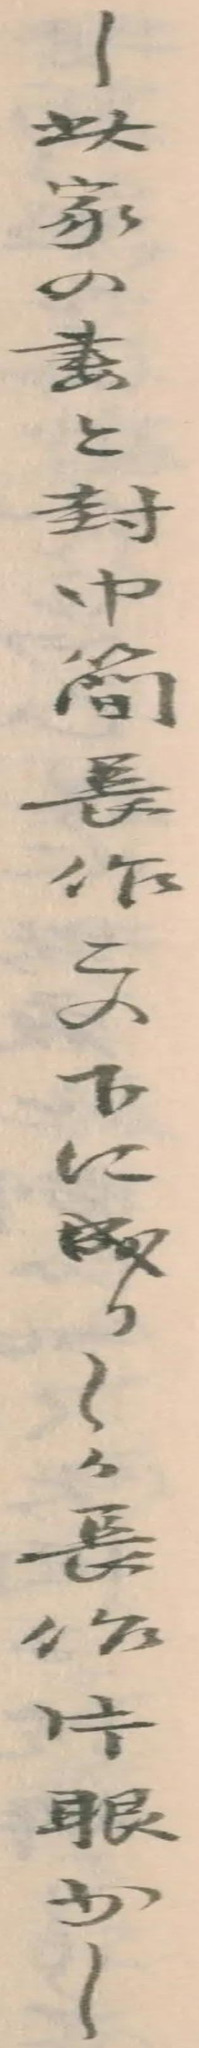し此家の妻と封巾簡長作この下に成りしか長作片眼少し
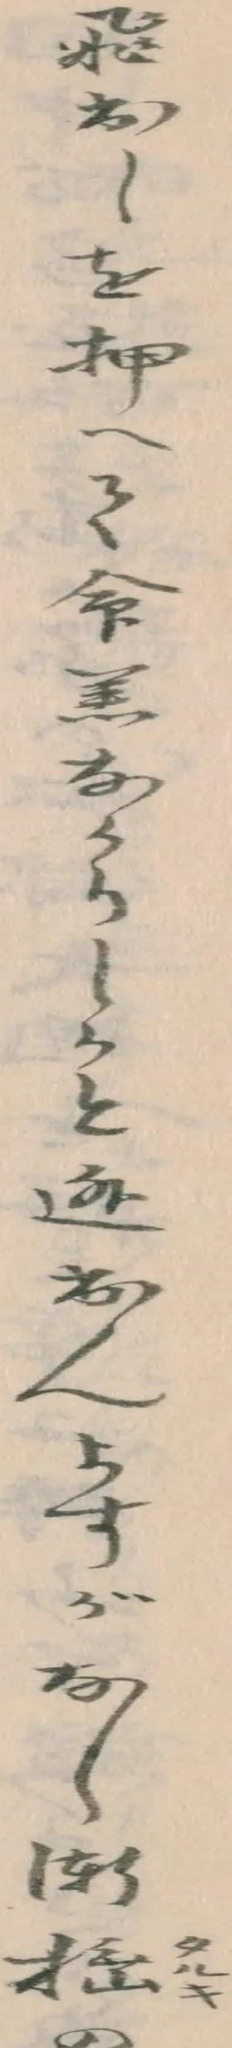飛出しを押へて命恙なかりしかと逃出んよすがなし漸棰の
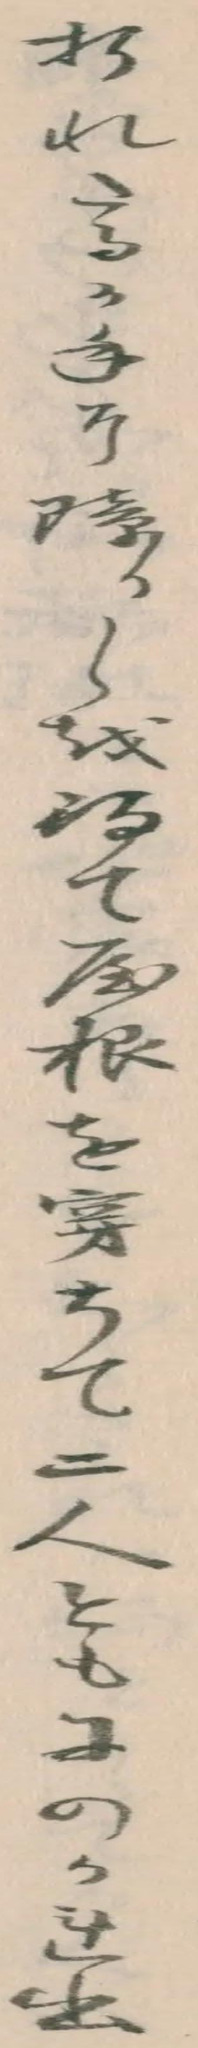折れたるか手に障りしを得て屋根を穿ちて二人ともにのかれ出
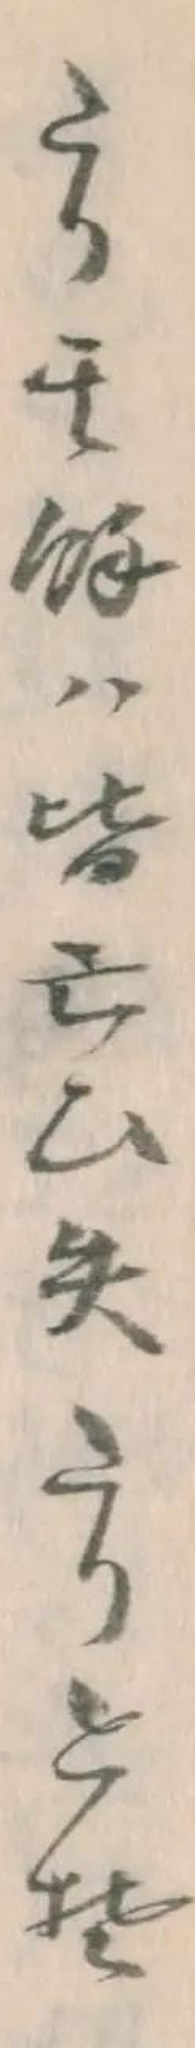たり其余は皆亡ひ失たりとそ
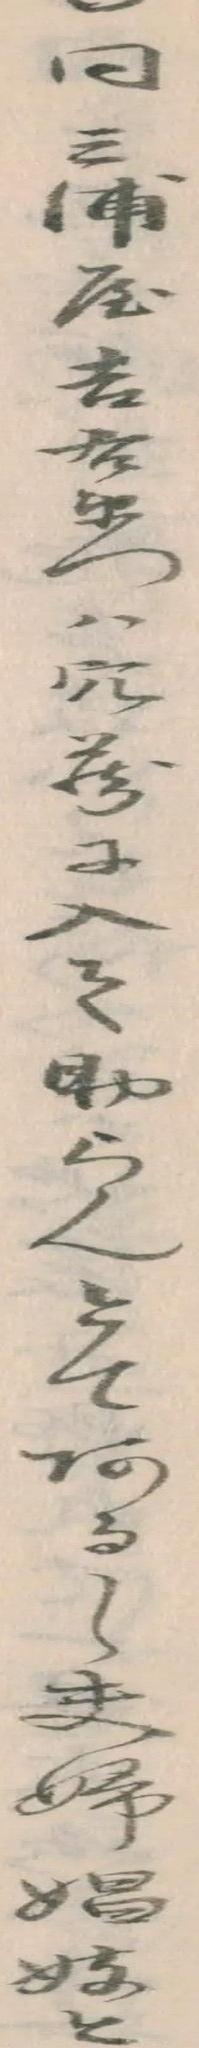〇同三浦屋吉右衛門は穴蔵に入て助らんとてあるし夫婦娼妓と
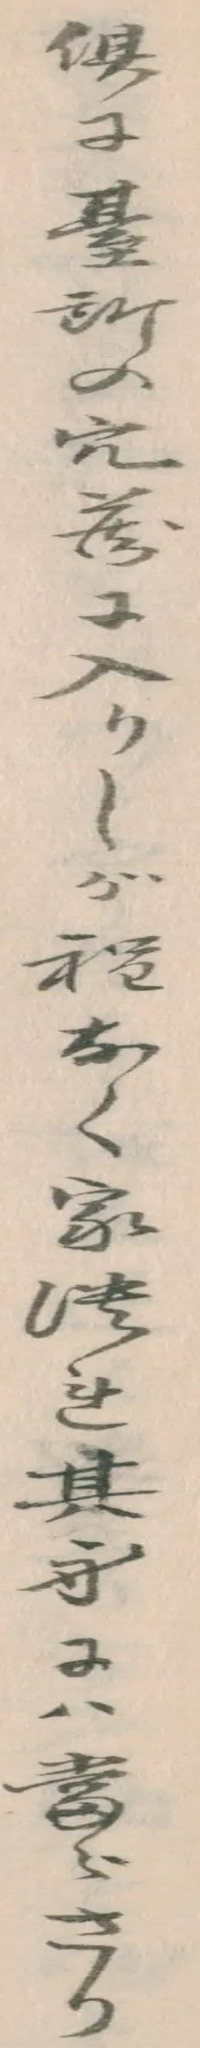倶に台所の穴蔵に入りしが程なく家潰れ其身には当らさり
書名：地災撮要. 巻10(地震之部) 上,下
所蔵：国立国会図書館 National Diet Library, JAPAN
